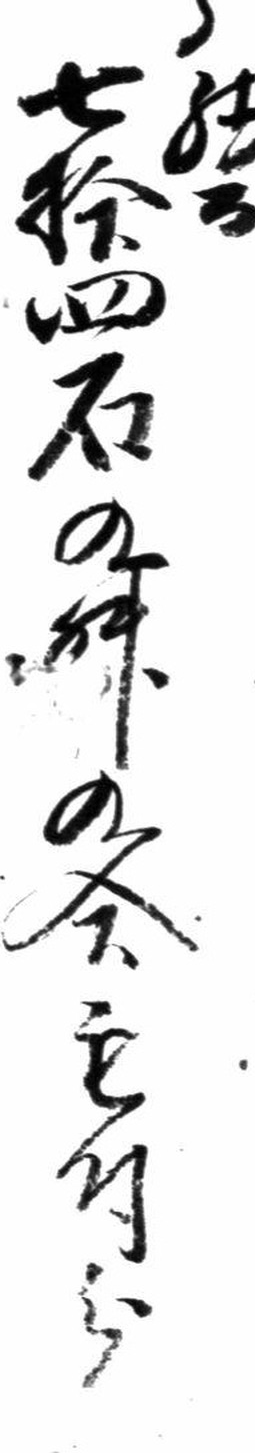七拾四石九升九合毛付分
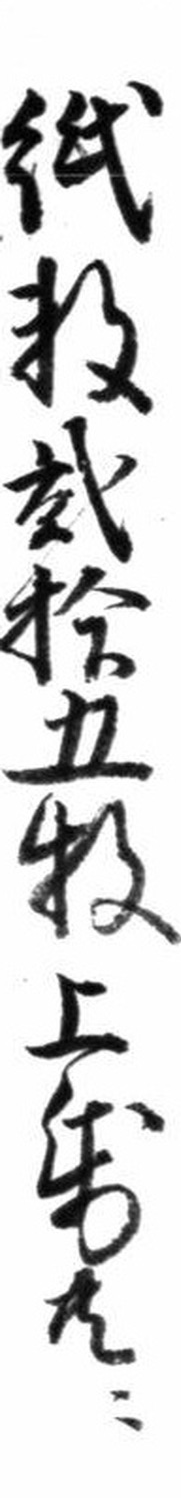紙数弐拾五枚上紙共ニ
